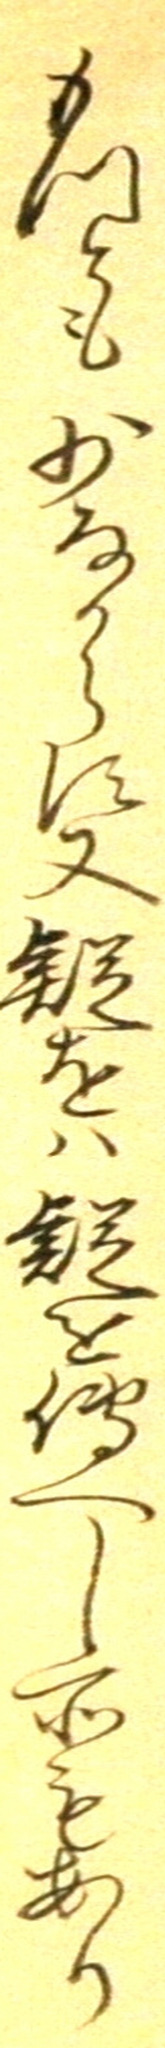もつとも少なからす又疑をは疑を伝へし所もあり
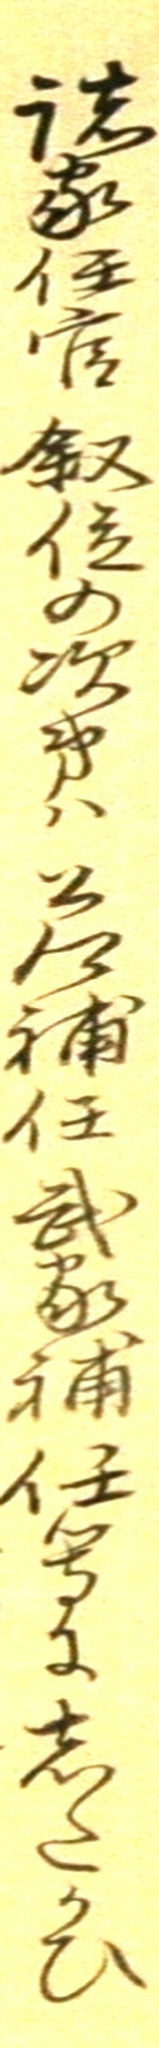諸家任官叙位の次第は公卿補任武家補任等にしたかひ
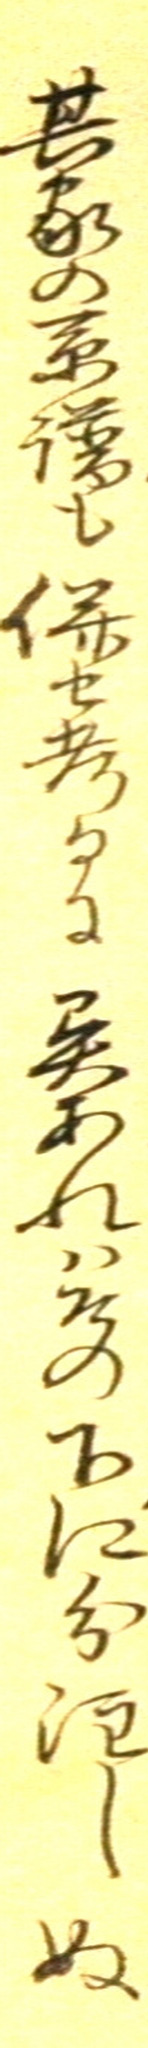其家の系譜も併せ考るに異あれはその下に分注しぬ

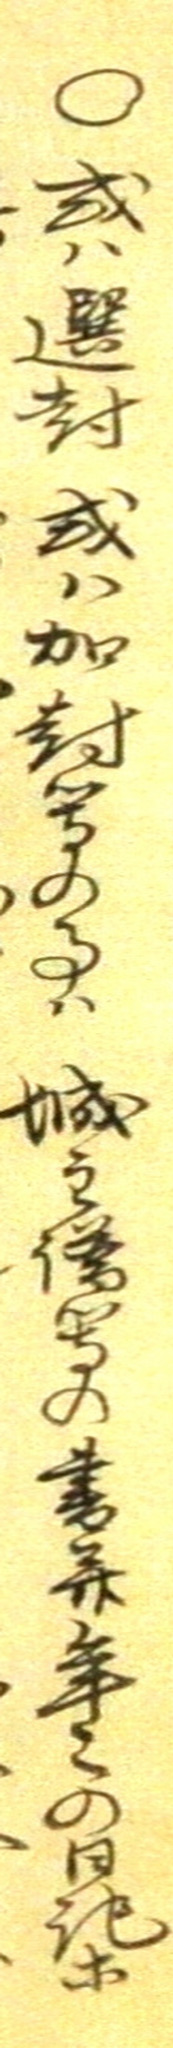○或は選封或は加封等の事は城主譜等の書并年々の日記等
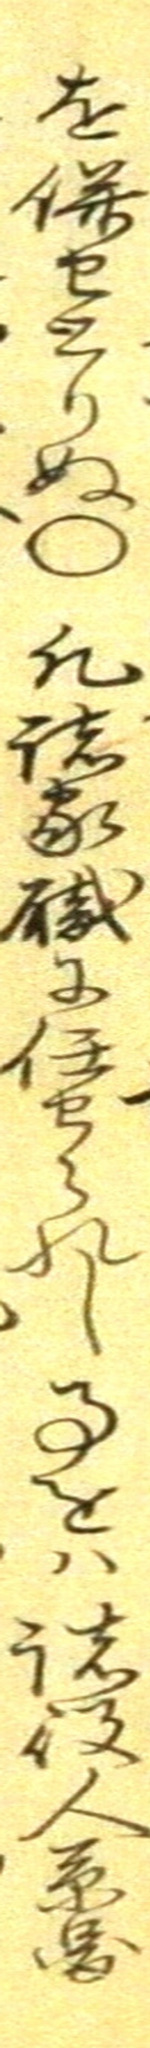を併せとりぬ○凡諸家職に任せられし事をは諸役人系図
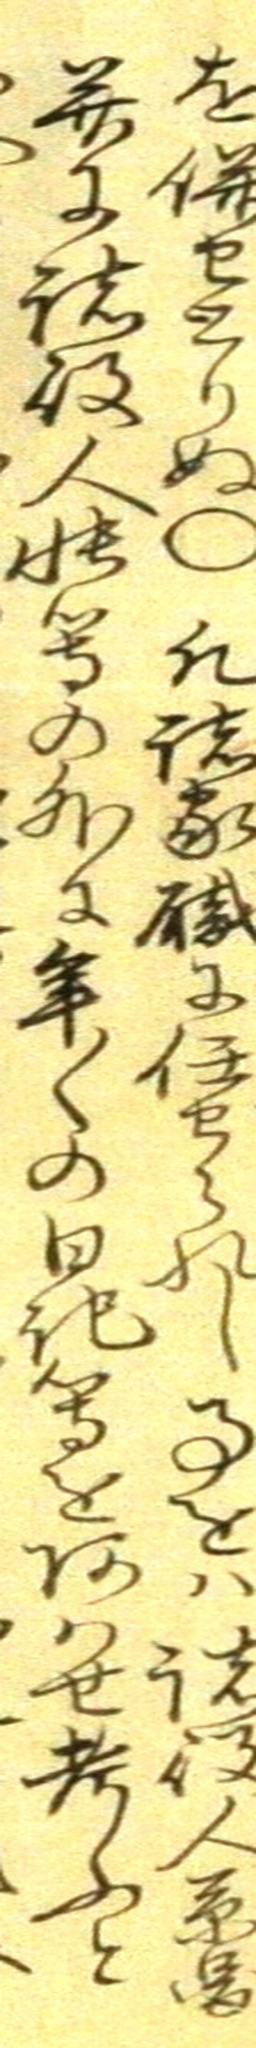并に諸役人帳等の外に年〳〵の日記等をあはせ考ふと
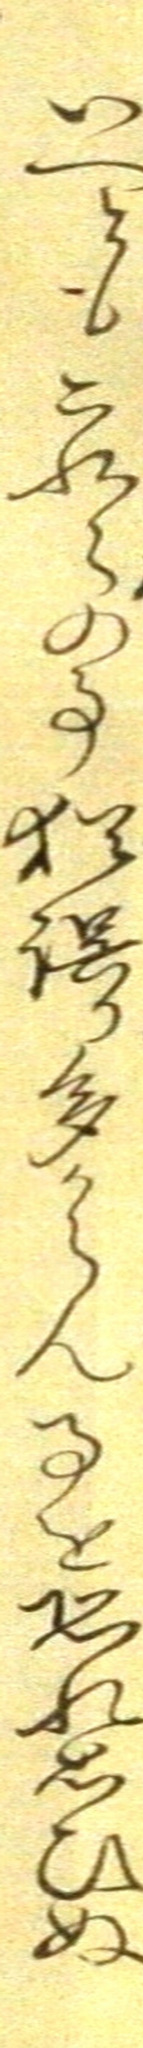いへともこれらの事猶誤り多からん事を恐れ思ひぬ
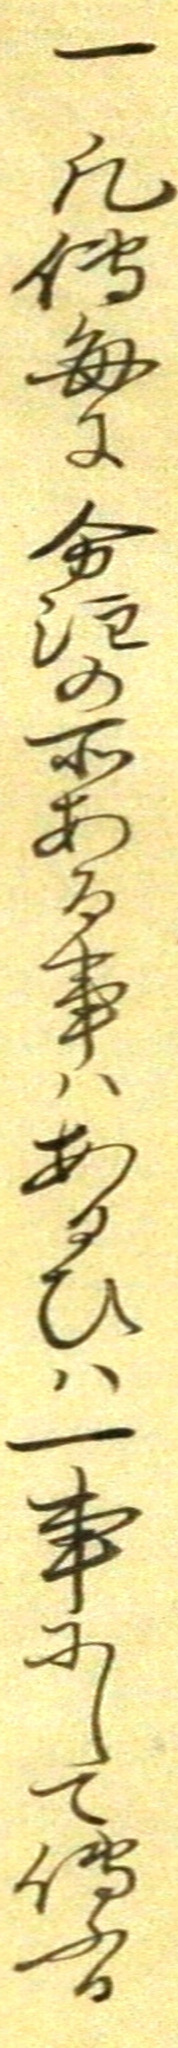一凡伝毎に分注の所ある事はあるひは一事にして伝ふる
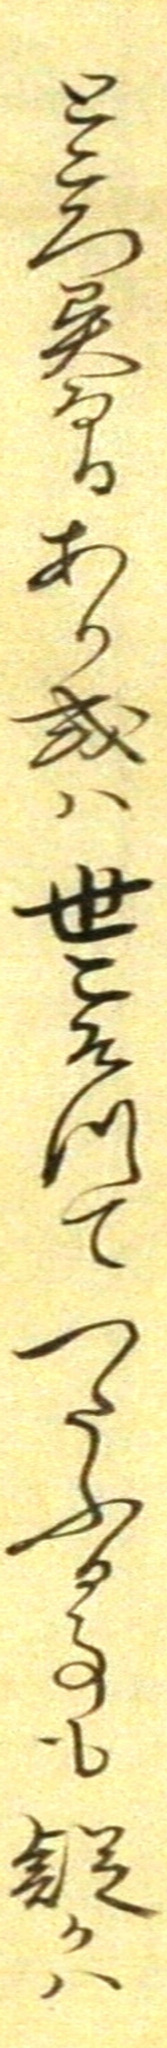ところ異なるあり或は世こそつてつたふる事も疑かは
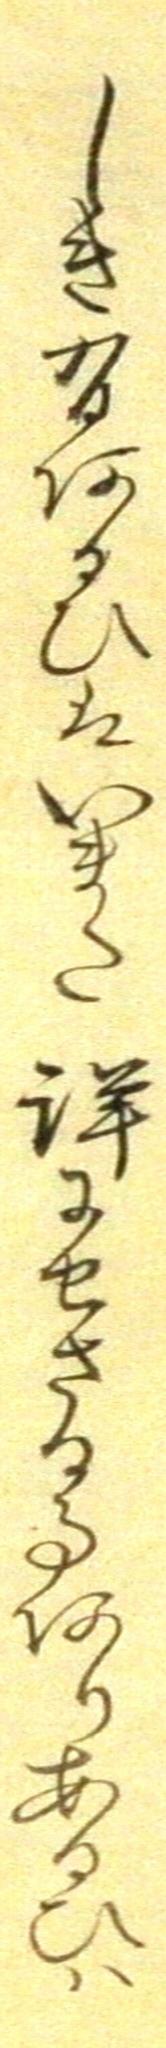しき有あるひはいまた詳にせさるありあるひは
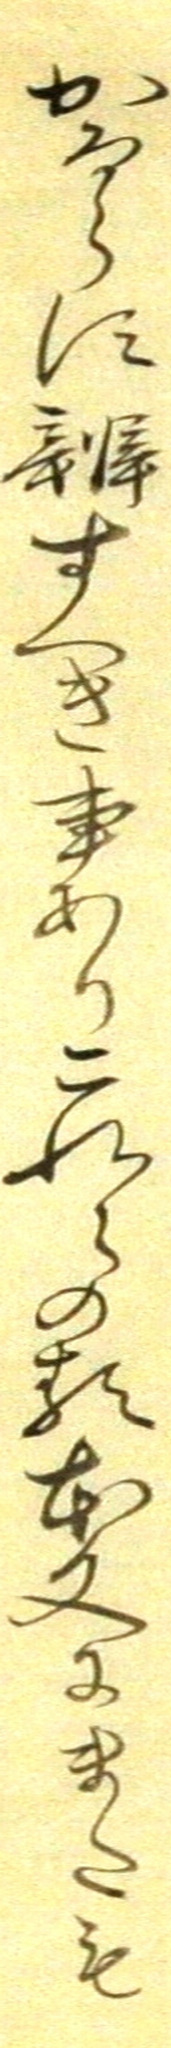かならす弁すへき事ありこれらの類本文にまたも
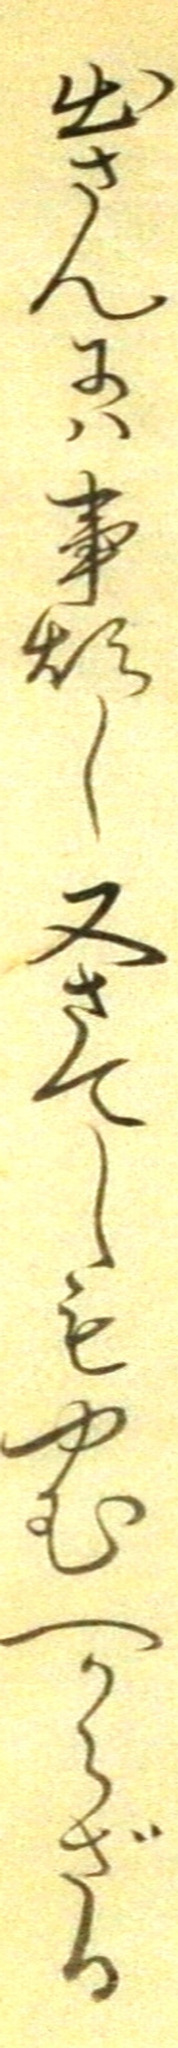出さんには事煩し又さてしもやむへからざる
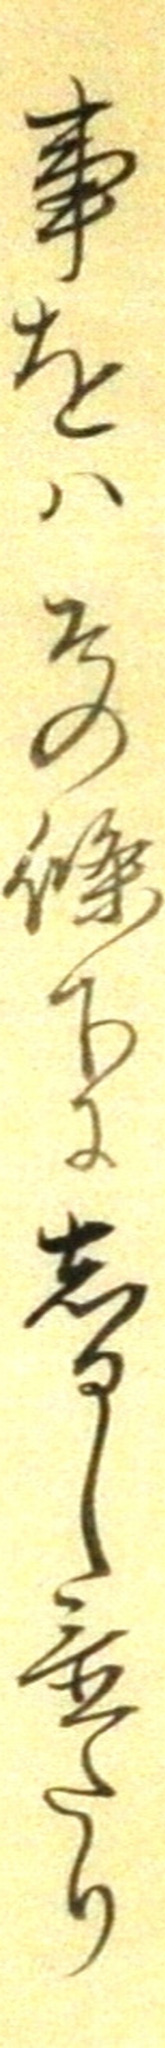事をはその条下にしるし置たり
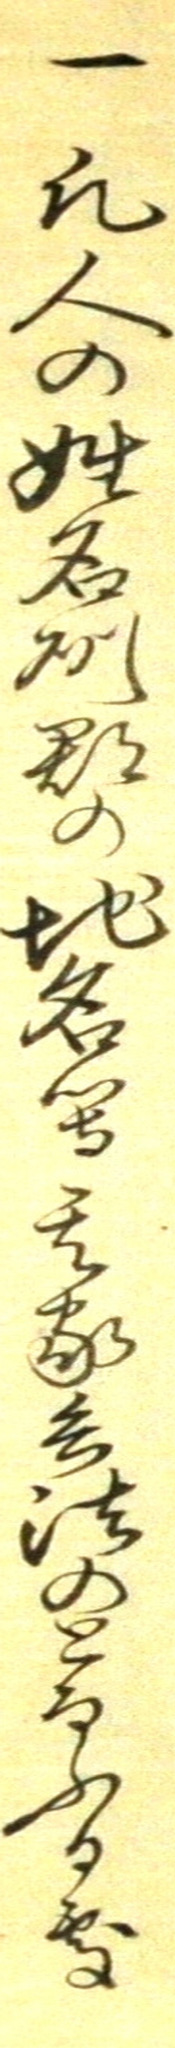一凡人の姓名州郡の地名等其家兵法のとなふる処
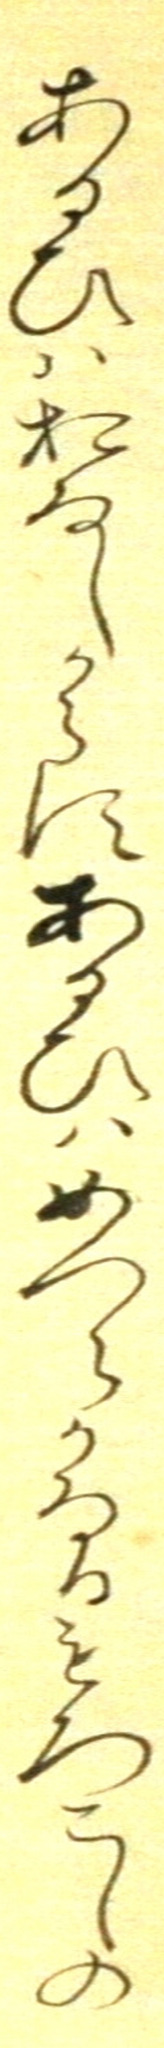あるひはおなしからすあるひはめつらかなるもろこしの
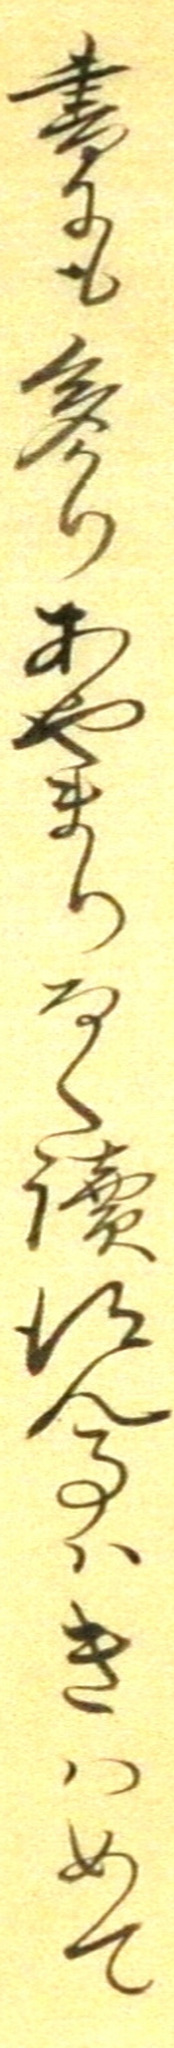書にも多かりあやまちなく読得ん事はきはめて
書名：藩翰譜（一）
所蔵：伊那市立高遠町図書館・合同会社AMANE
